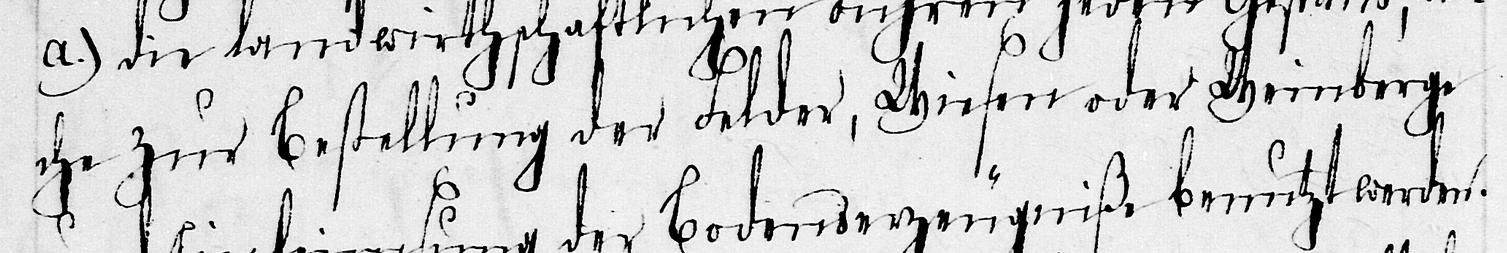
lche zur Bestellung der Felder, Wiesen oder Weinberge
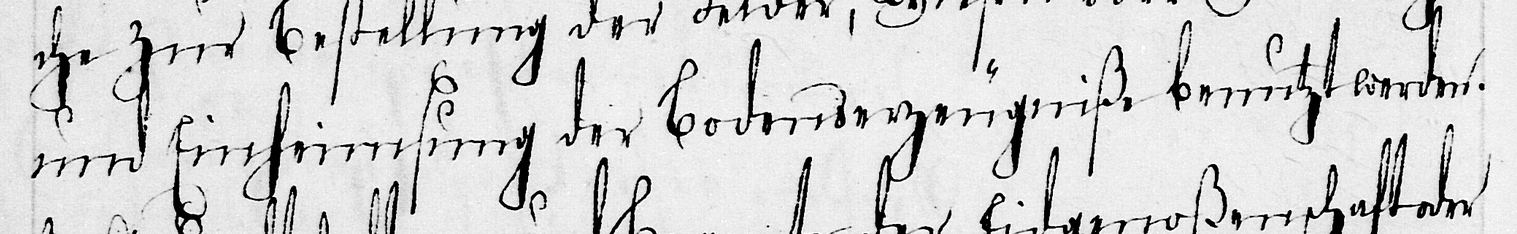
und Einheimsung der Bodenserzeugniße benutzt werden.
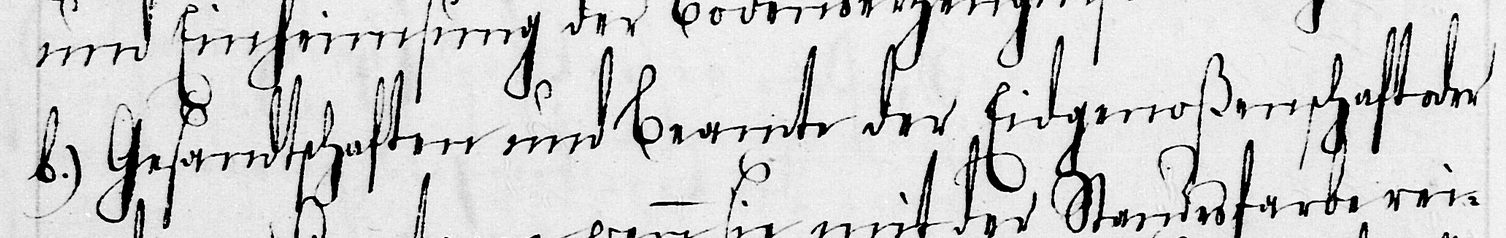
b.) Gesandtschaften und Beamte der Eidgenoßenschaft oder
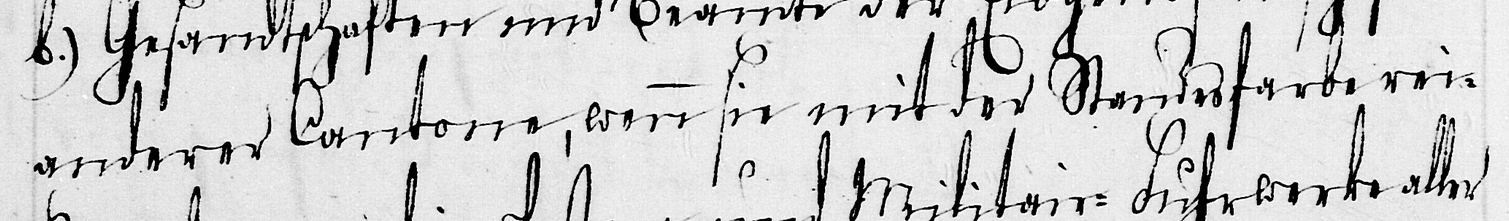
anderer Cantone, wenn sie mit der Standesfarbe rei¬
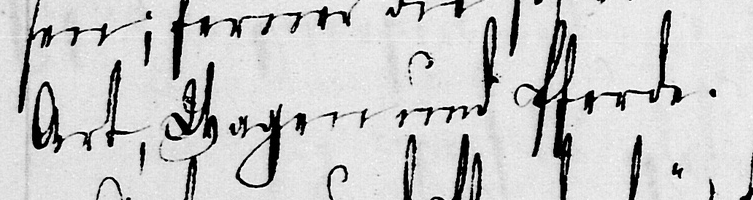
Art, Wagen und Pferde.
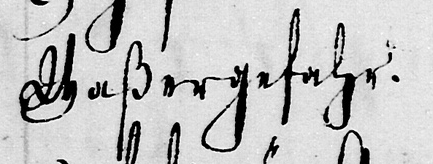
Waßergefahr.
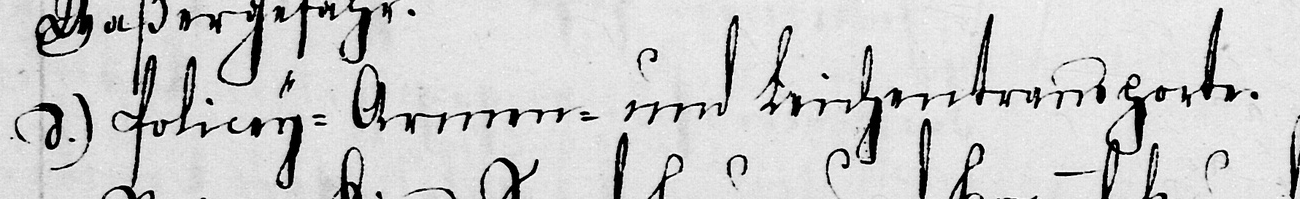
d.) Policey-[,] Armen- und Leichentransporte.
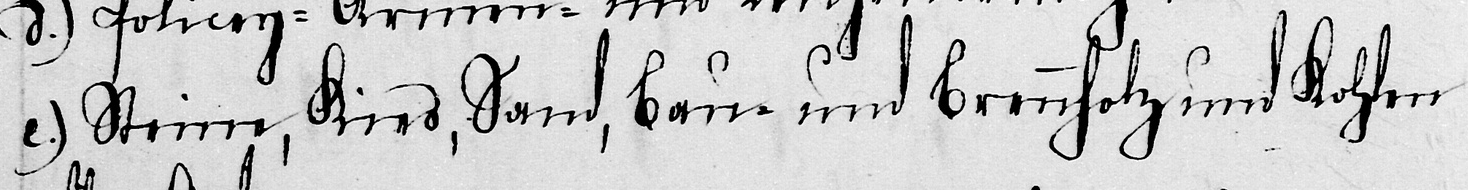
e.) Steine, Kies, Sand, Bau- und Brennholz und Kohlen
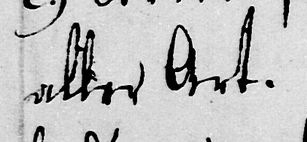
aller Art.
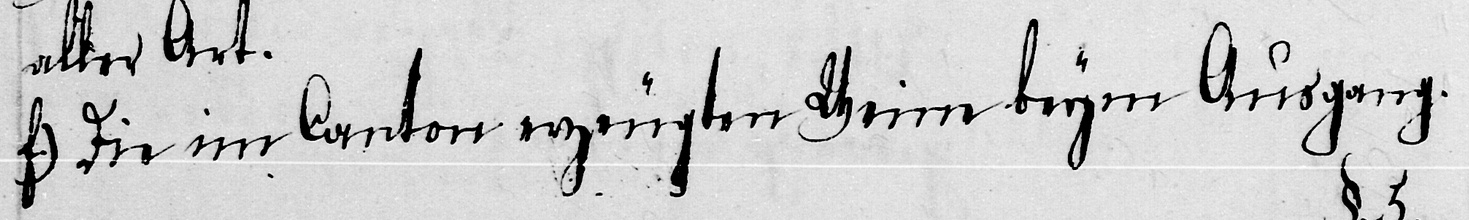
f.) Die im Canton erzeugten Weine beym Ausgang.
